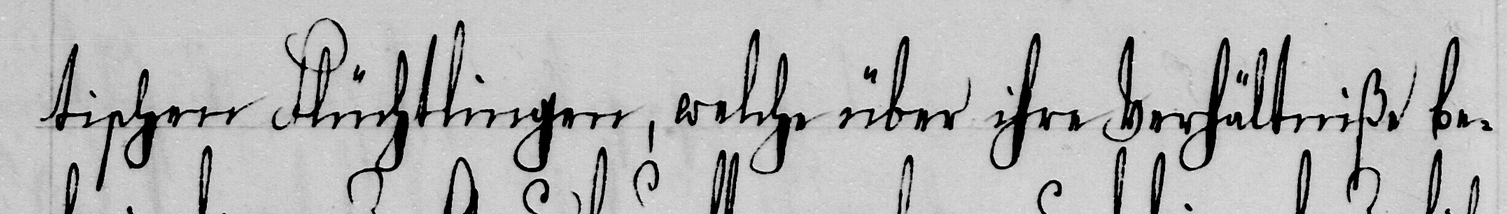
tischen Flüchtlingen, welche über ihre Verhältniße be¬
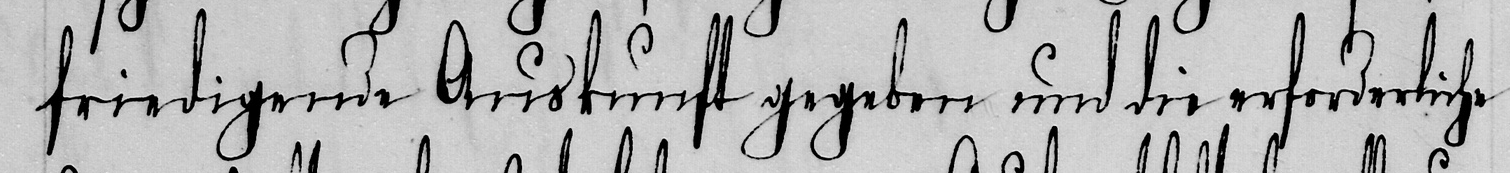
friedigende Auskunft gegeben und die erforderlic¬
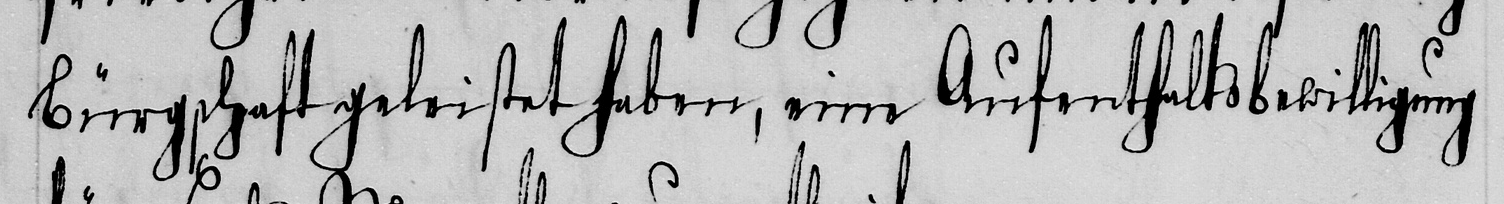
Bürgschaft geleistet haben, eine Aufenthaltsbewillig¬
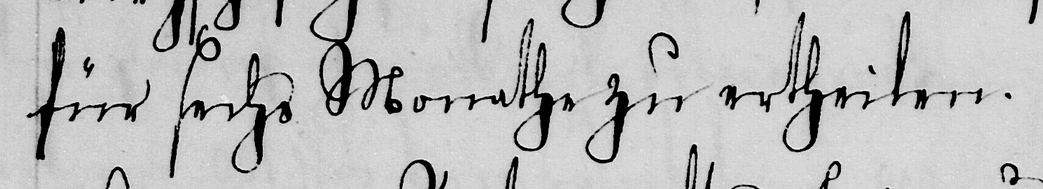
für sechs Monathe zu ertheilen.
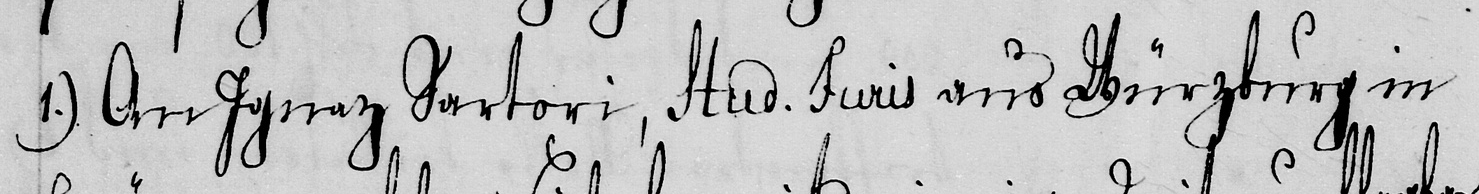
1.) An Ignaz Sartori, Stud. Juris aus Würzburg in
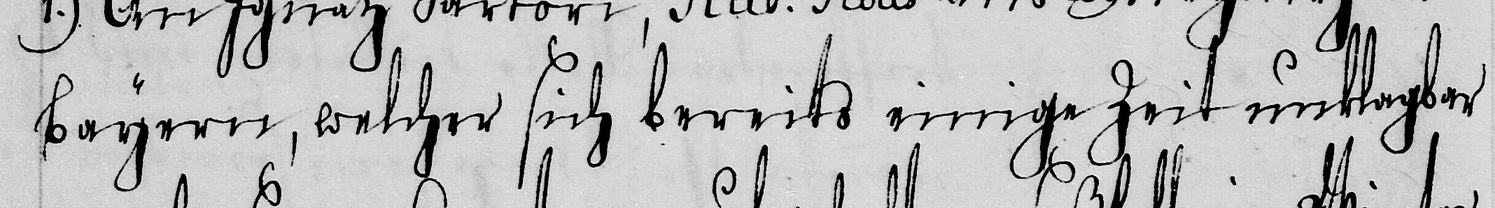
Bayern, welcher sich bereits einige Zeit unklagbar
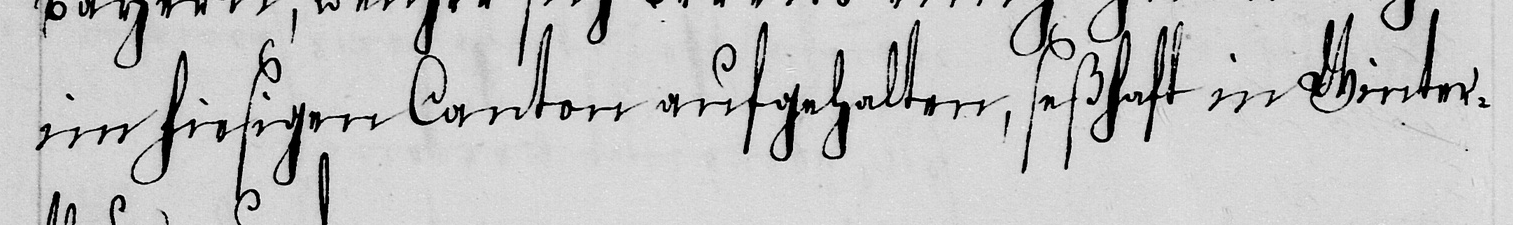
im hiesigen Canton aufgehalten, seßhaft in Winter¬
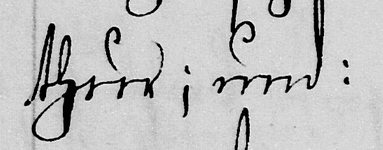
thur; und:
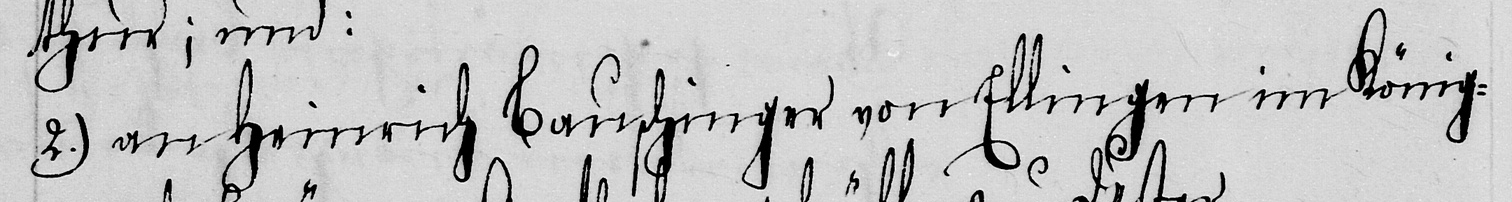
2.) an Heinrich Bauschinger von Ellingen im König¬
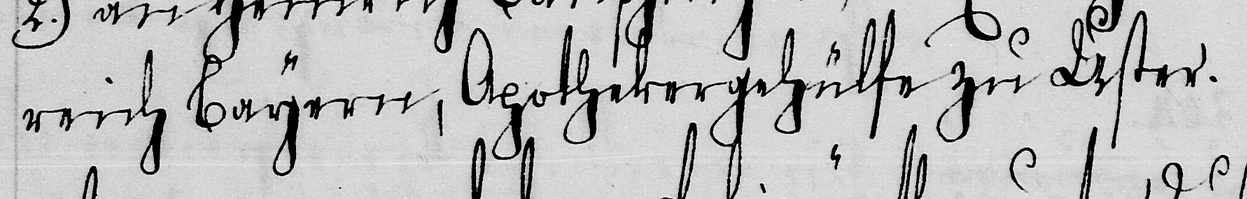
reich Bayern, Apothekergehülfe zu Uster.
